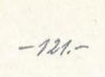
121
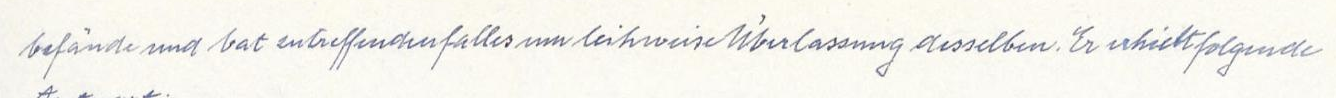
befände und bat zutreffendenfalles um leihweise Überlassung desselben. Er erhielt folgende
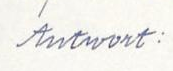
Antwort:
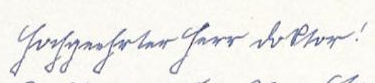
Hochgeehrter Herr Doktor!
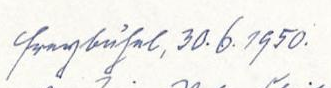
Freybühel, 30. 6. 1950
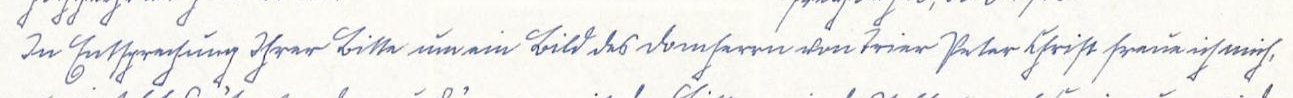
In Entsprechung Ihrer Bitte um ein Bild des Domherrn von Trier Peter Christ freue ich mich,
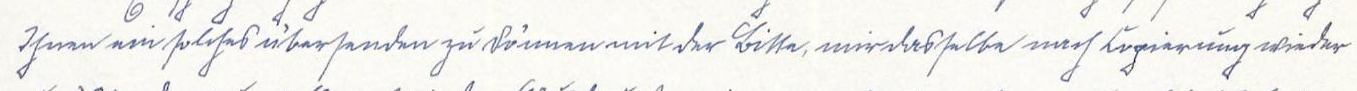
Ihnen ein solches übersende zu können mit der Bitte, mir dasselbe nach Copierung wieder
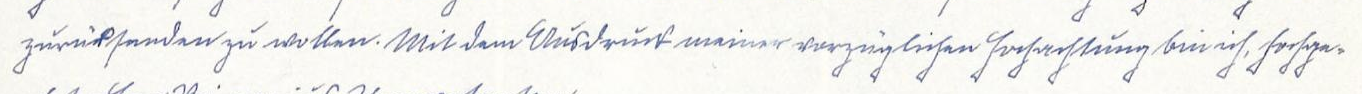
zurüksenden zu wollen. Mit dem Ausdruck meiner vorzüglichen Hochachtung bin ich, hochge-
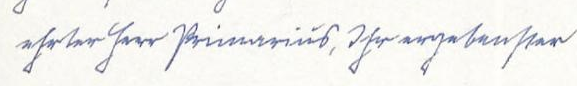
ehrter Herr Primarius, Ihr ergebenster
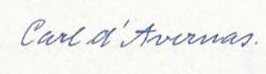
Carl d' Avernas
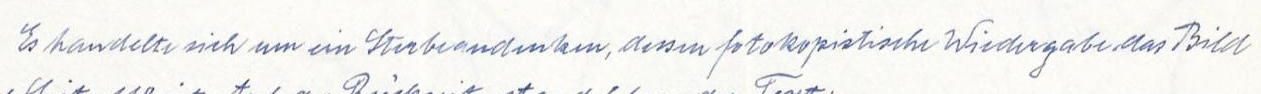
Es handelte sich um ein Sterbeandenken, dessen fotokopistische Wiedergabe das Bild
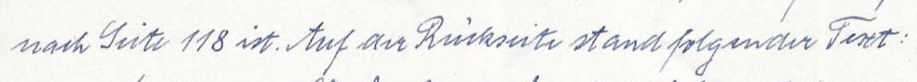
nach Seite 118 ist. Auf der Rückseite stand folgender Text:
